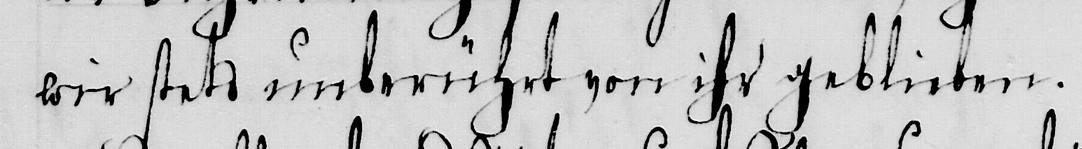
wir stets unberührt von ihr geblieben.
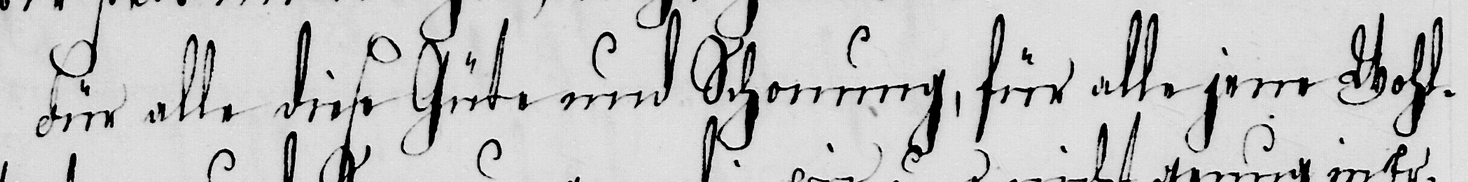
Für alle diese Güte und Schonung, für alle jene Wohl¬
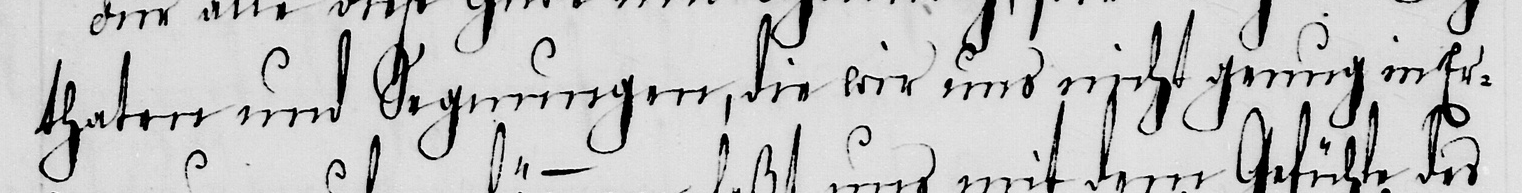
thaten und Segnungen, die wir uns nicht genug in Eri¬
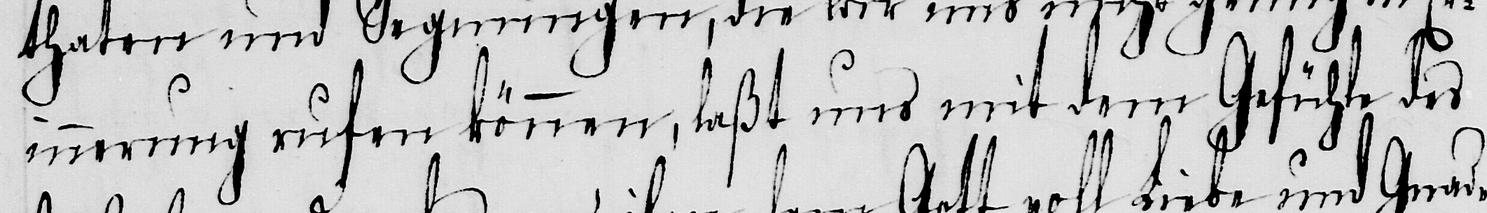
nnerung rufen können, laßt uns mit dem Gefühle des
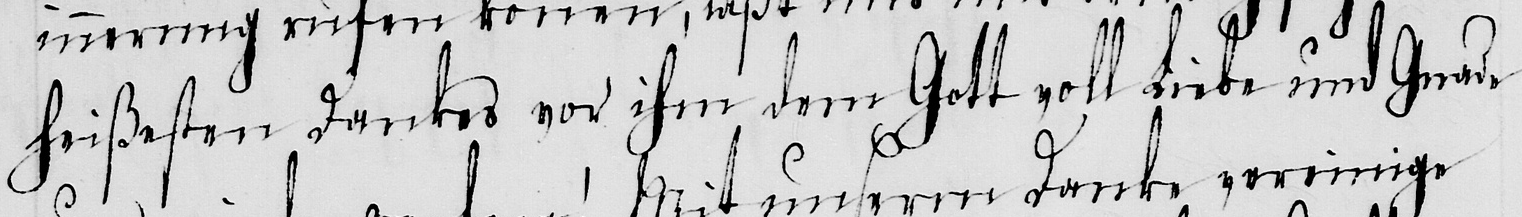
heißesten Dankes vor ihm dem Gott voll Liebe und Gnade
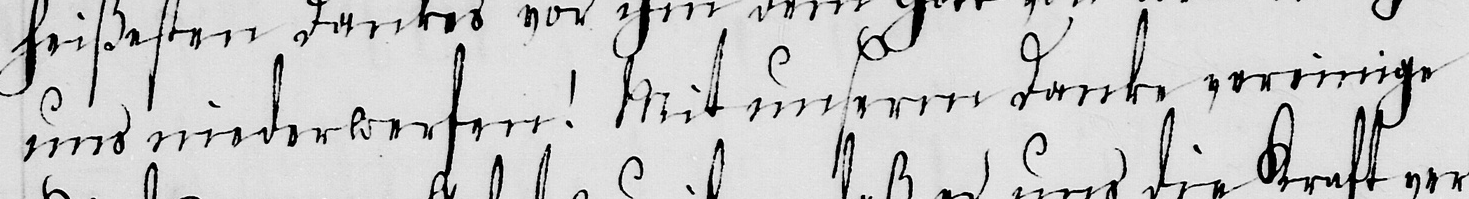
uns niederwerfen! Mit unserm Danke vereinige
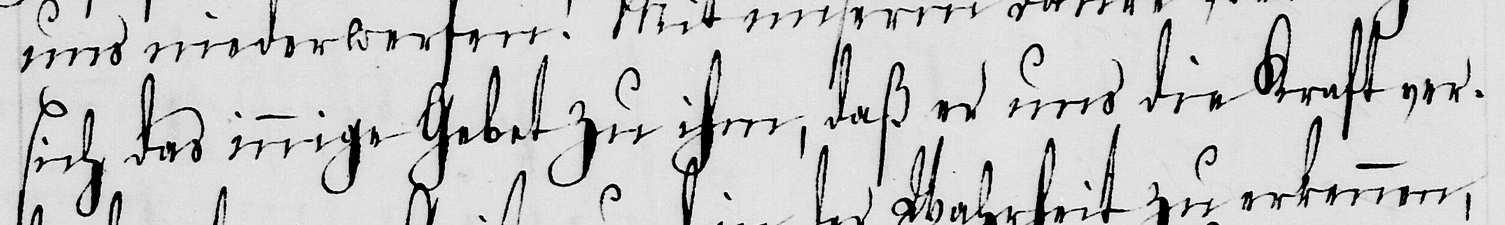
sich das innige Gebet zu ihm, daß er uns die Kraft ver¬
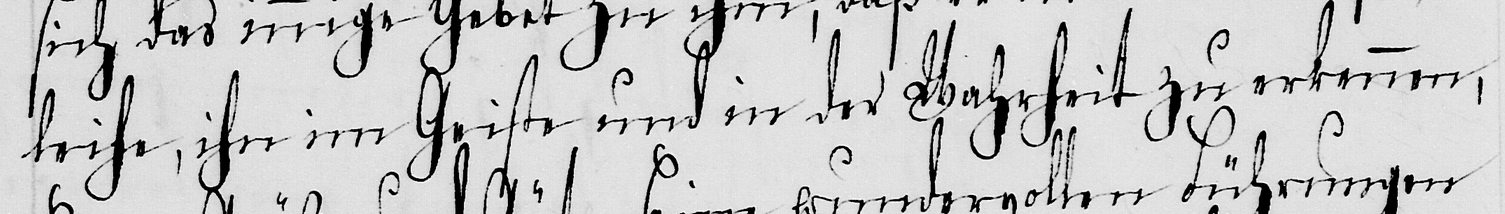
leihe, ihn im Geiste und in der Wahrheit zu erkennen,
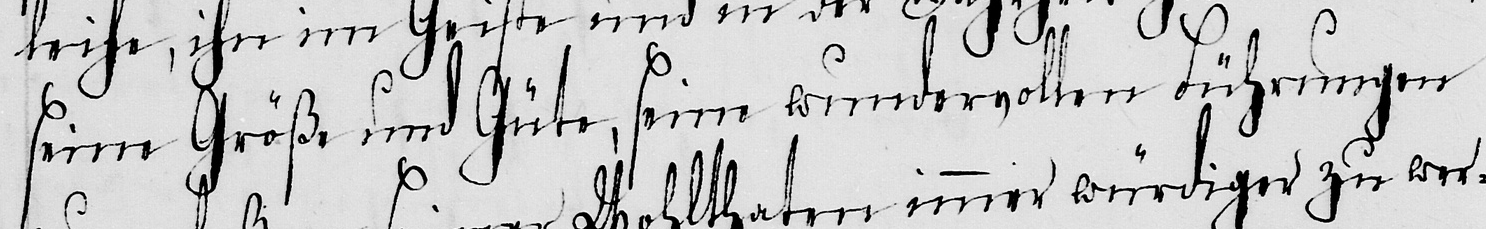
seine Größe und Güte, seine wundervollen Führungen
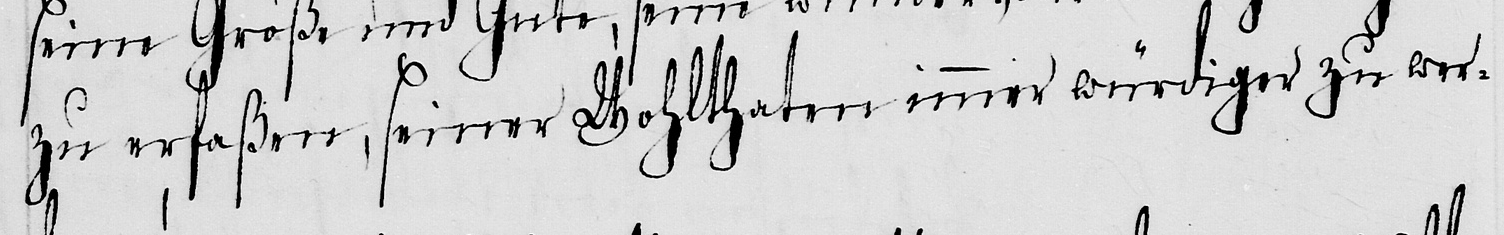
zu erfaßen, seiner Wohlthaten immer würdiger zu wer¬
